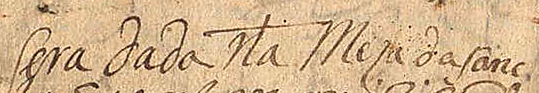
sera dada Na Meza da sanc
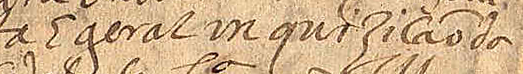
ta E geral inquiziçaõ da
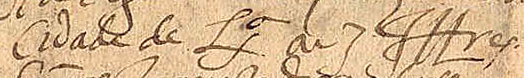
Cidade de Lxa aos J̄lltres.
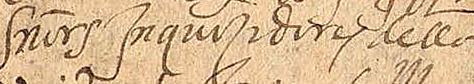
Snōrs Jnquizidores della
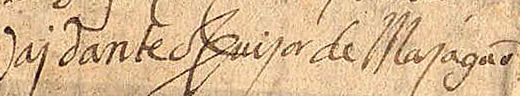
Vaj dante o Ꝓuizor de Mazagaõ
